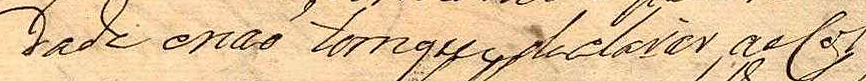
dade e naõ tem que declarar ao Cos
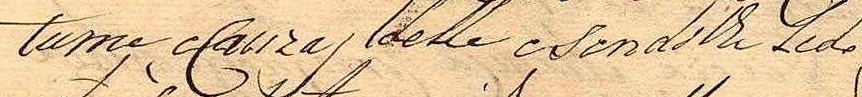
tume, e Cauzas delle e sendolhe Lido
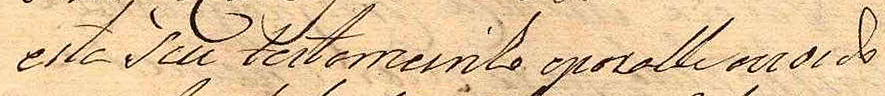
este seu testemunho e por elle ouvido
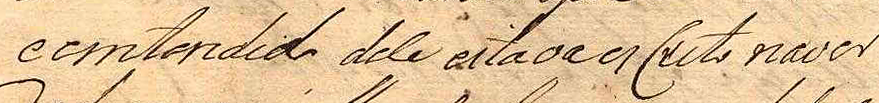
e emtendido diCe estava esCrito na ver
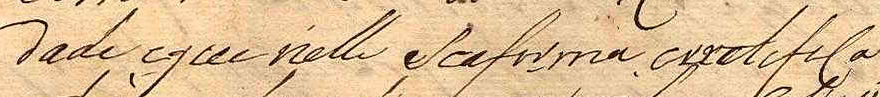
dade, e que nelle se afirma, e rratefiCa
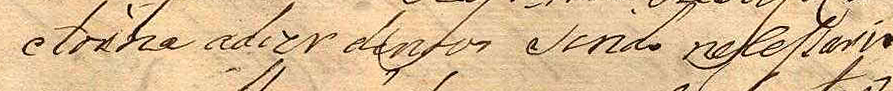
e torna a dizer e novo sendo neCessario
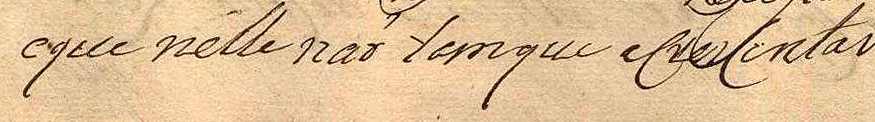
e que nelle naõ tem que aCresCentar
